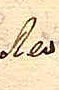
Reo
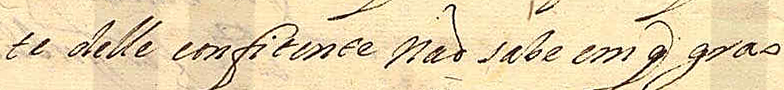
te delle confitente não sabe em q̄ grao
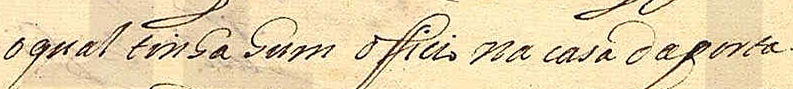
o qual tinha hum officio na casa da porta
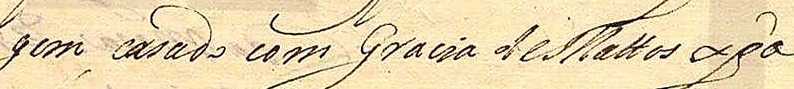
gem, casado com Gracia de Mattos xp̄a
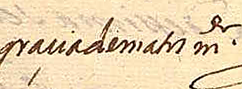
graçia de matos mer.
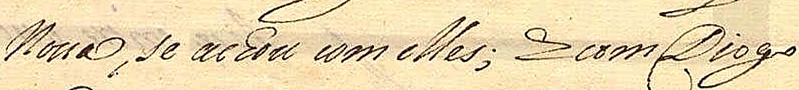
Noua, se achou com elles; E com Diogo
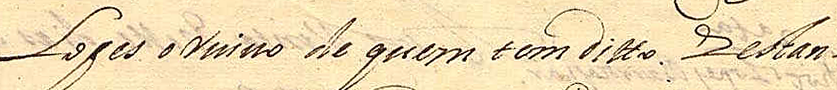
Lopes o viuuo de quem tem ditto. E estan
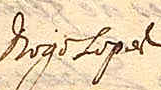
Diogo Lopes
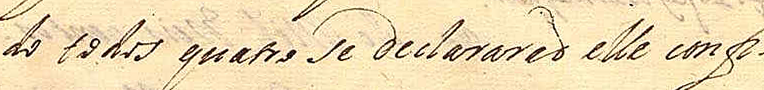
do todos quatro se declararão elle confi
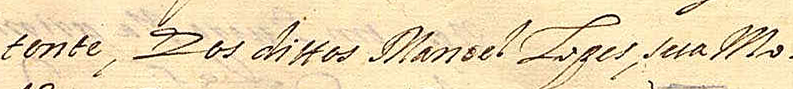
tente, E os dittos Manoel Lopes, sua Mo
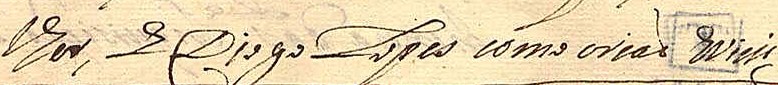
lher, E Diogo Lopes como crião E viui
